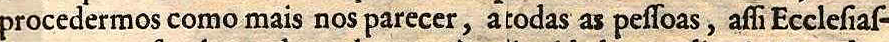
procedermos como mais nos parecer, a todas as pessoas, assi Ecclesias
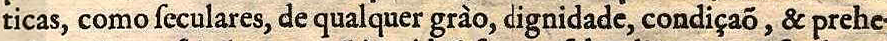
ticas, como seculares, de qualquer grào, dignidade, condiçaõ, & prehe
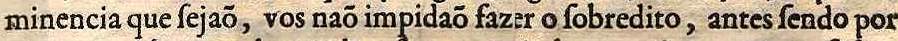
minencia que sejaõ, vos naõ impidaõ fazer o sobredito, antes sendo por
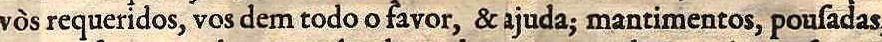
vòs requeridos, vos dem todo o favor, & ajuda; mantimentos, pousadas,
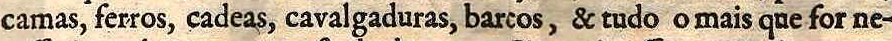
camas, ferros, cadeas, cavalgaduras, barcos, & tudo o mais que for ne
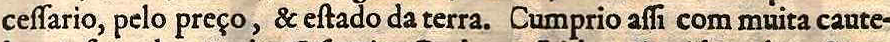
cessario, pelo preço, & estado da terra. Cumprio assi com muita caute
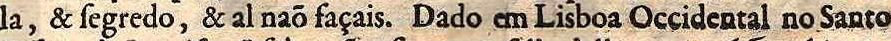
la, & segredo, & al naõ façais. Dado em Lisboa Occidental no Santo
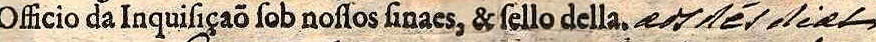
Officio da Inquisiçaõ sob nossos sinaes, & sello della. Aos dés dias
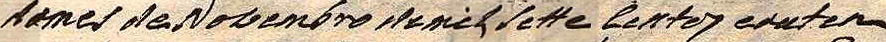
do mes de Novembro de mil settecentos e outen
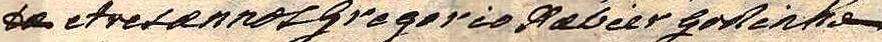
ta e tres annos Gregorio Xavier Godinho
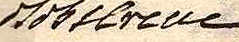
o sobrescrevi
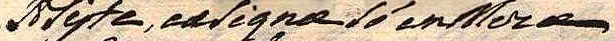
Asiste, e asigna só em Meza
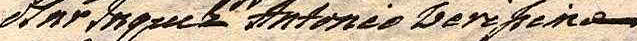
o Snr̄ Inquiz.or Antonio Verissimo
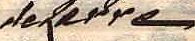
de Larre
